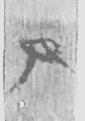四
